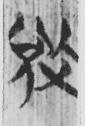敓（說）
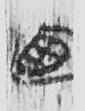廼
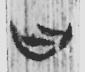曰
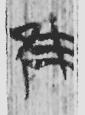隹
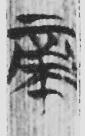帝
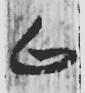㠯（以）
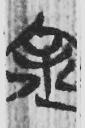余
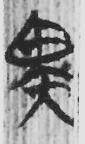畀
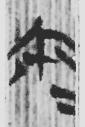尔=
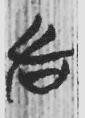左
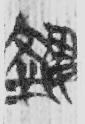執
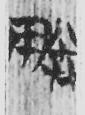朕
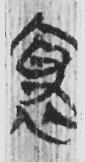袂
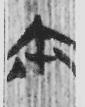尔
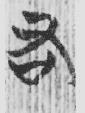右
